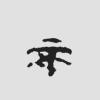不
